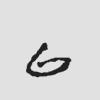㠯（以）
